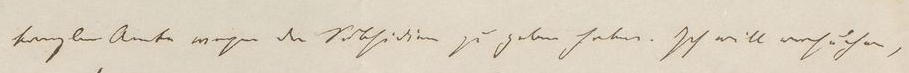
kanzler Amte wegen der Subsidien zu geben haben. Ich will versuchen,
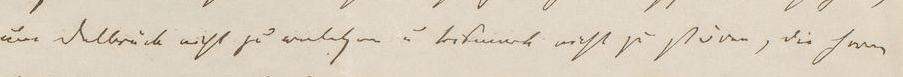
um Delbrück nicht zu verletzen u Bismark nicht zu stören, die Herrn
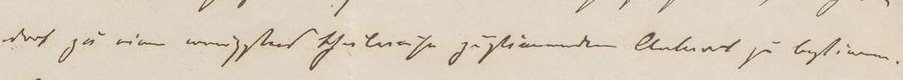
dort zu einer wenigstens theilweise zustimmenden Antwort zu bestimmen.
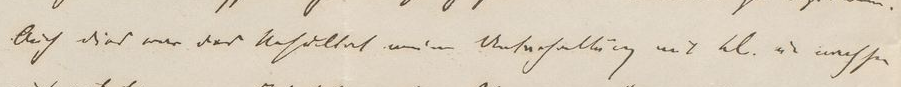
Auch dies war das Resultat meiner Unterhaltung mit Bl. u nachher
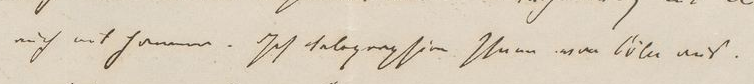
auch mit Hammer. Ich telegraphire Ihnen von Cöln aus.
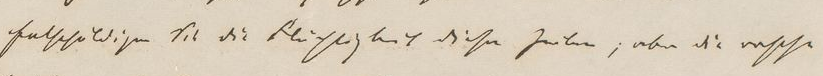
Entschuldigen Sie die Flüchtigkeit dieser Zeilen, aber die rasche
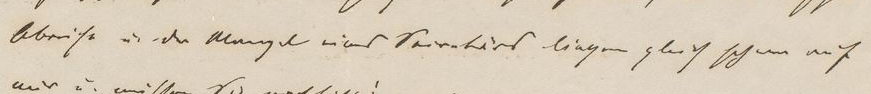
Abreise u. der Mangel eines Secretärs liegen gleich schwer auf
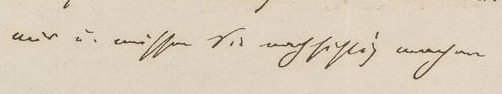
mir u. müssen Sie nachsichtig machen.
